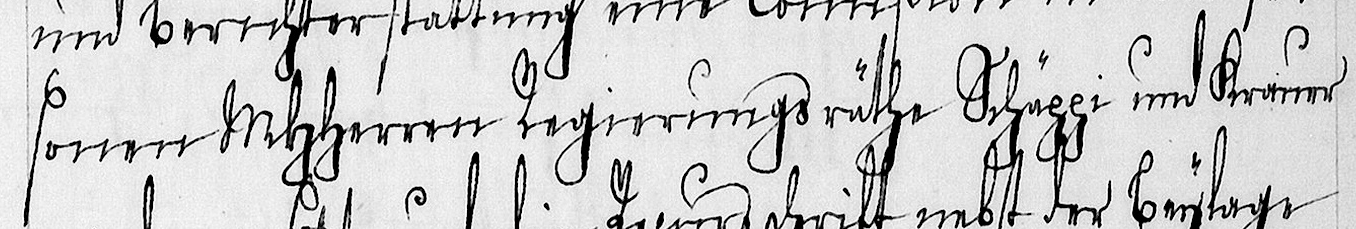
sonen MHHerren Regierungsräthe Schäppi und Krauer
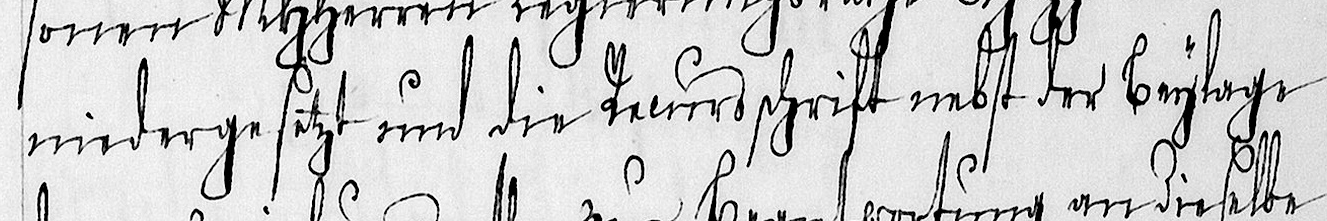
niedergesetzt und die Recursschrift nebst der Beylage
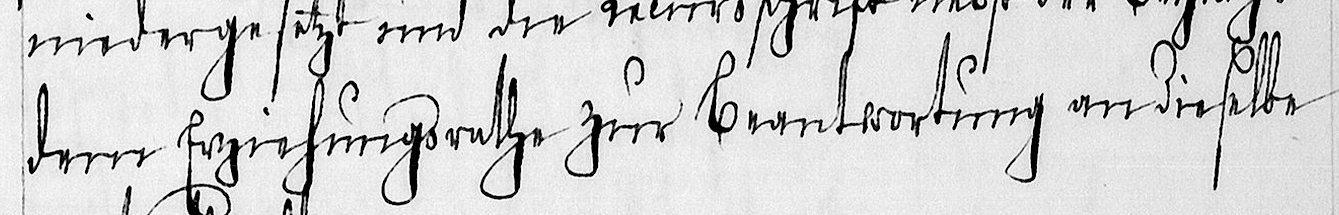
dem Erziehungsrathe zur Beantwortung an dieselbe
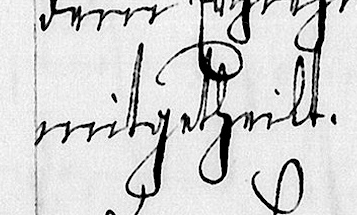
mitgetheil¬
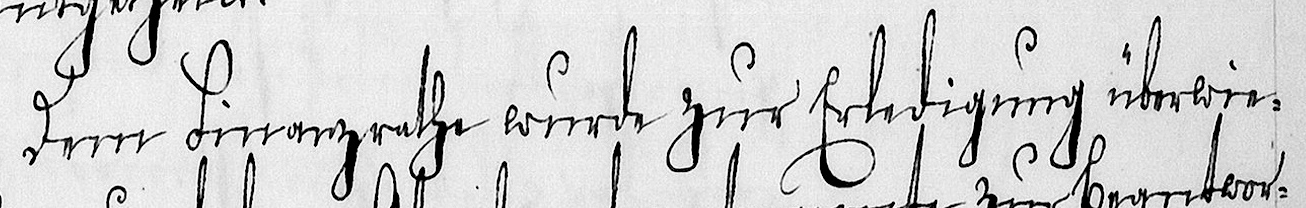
Dem Finanzrathe wurde zur Erledigung überwie¬
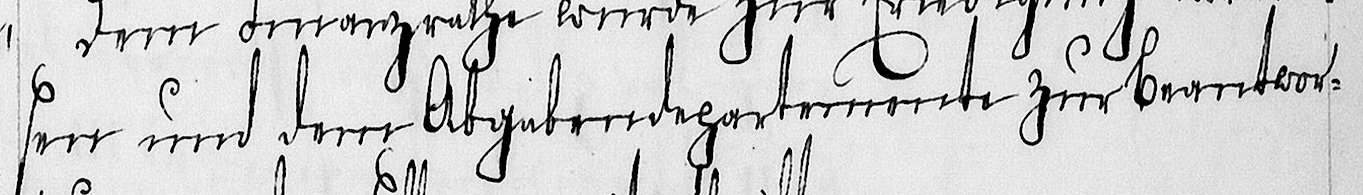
sen und dem Abgabendepartemente zur Beantwor¬
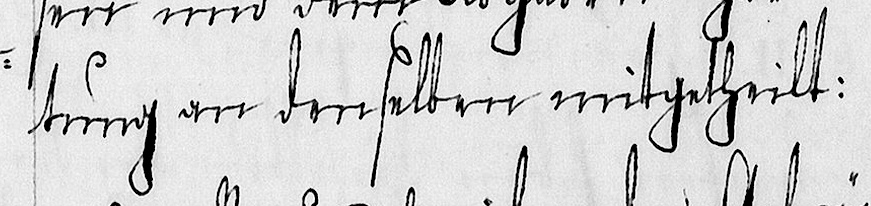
tung an denselben mitgetheilt:
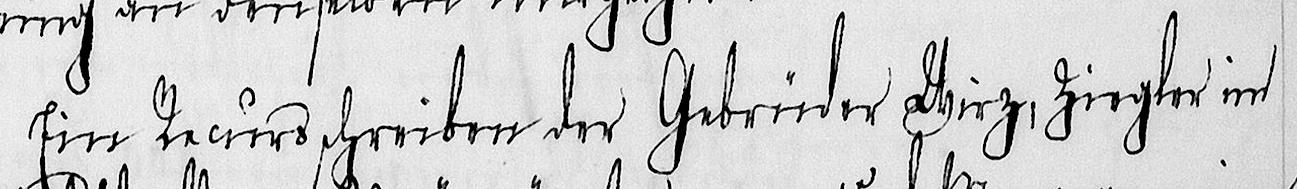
Ein Recursschreiben der Gebrüder Wirz, Ziegler im
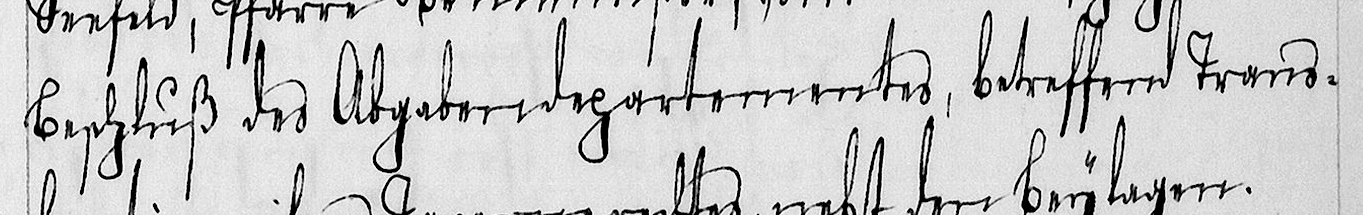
Beschluß des Abgabendepartementes, betreffend Trans¬
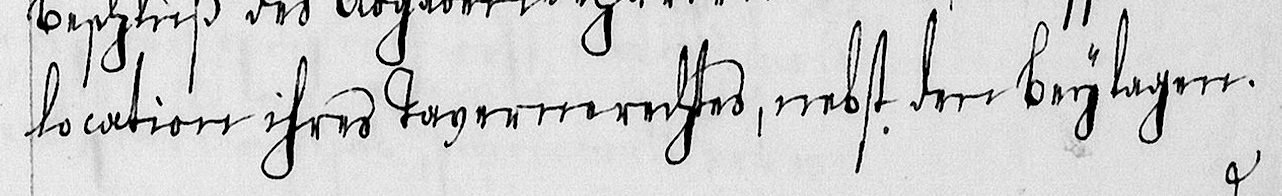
location ihres Tavernerechtes, nebst den Beylagen.
